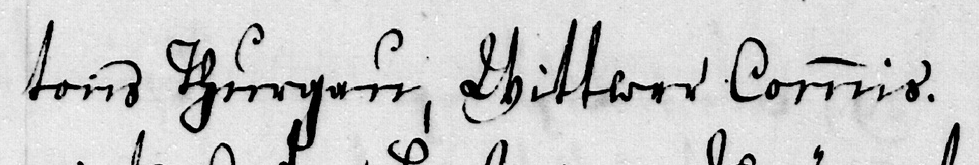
tons Thurgau, Wittwer Commis.
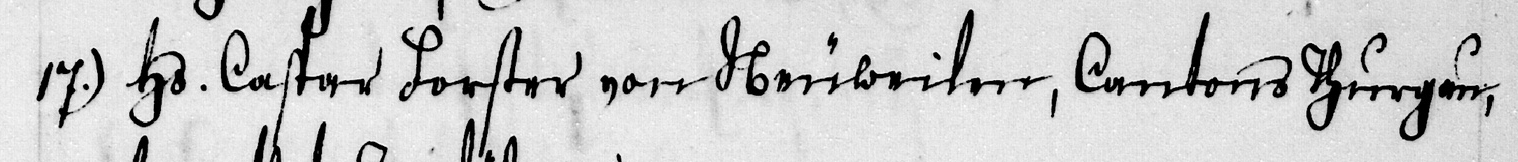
17.) Hs. Caspar Forster von Neuweilen, Cantons Thurgau,
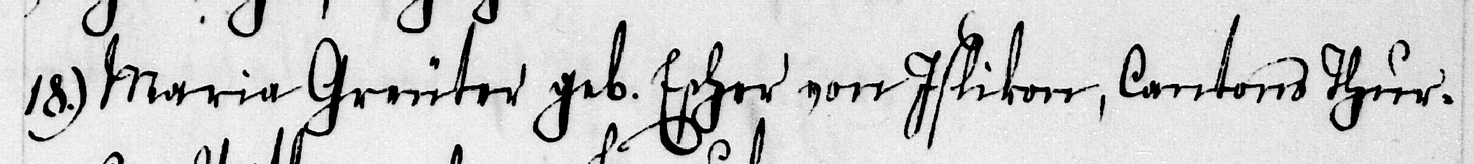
18.) Maria Greuter geb. Escher von Islikon, Cantons Thur¬
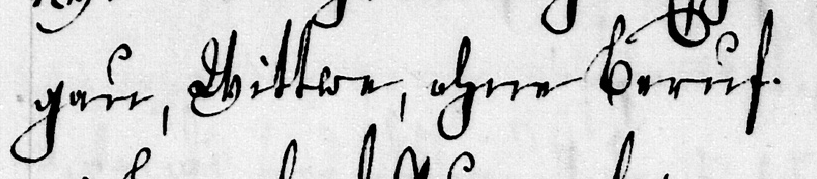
gau, Wittwe, ohne Beruf.
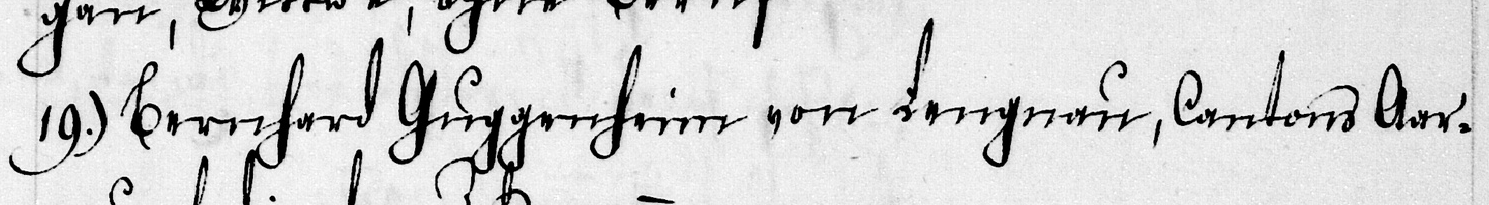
19.) Bernhard Guggenheim von Lengnau, Cantons Aar¬
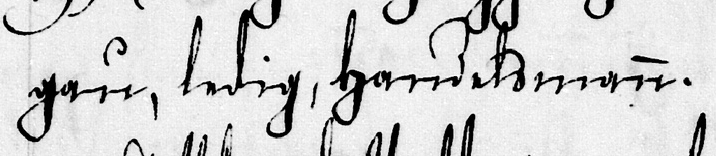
gau, ledig, Handelsmann.
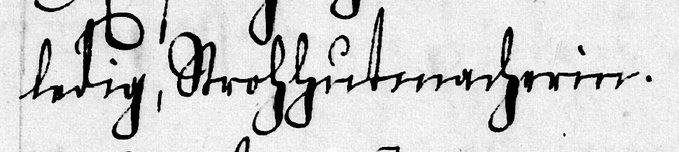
ledig, Strohhutmacherin.
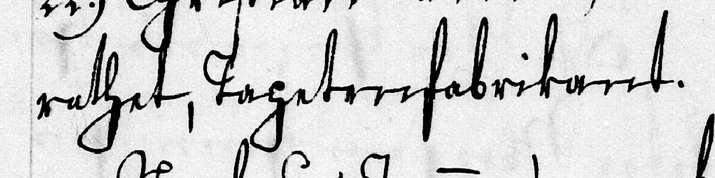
rathet, Tapetenfabrikant.
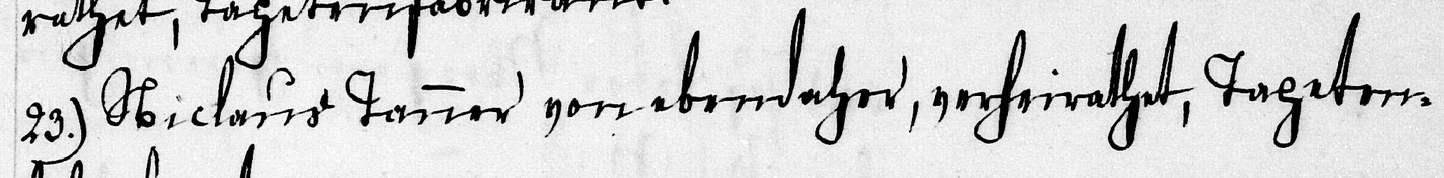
23.) Niclaus Tanner von ebendaher, verheirathet, Tapeten¬
